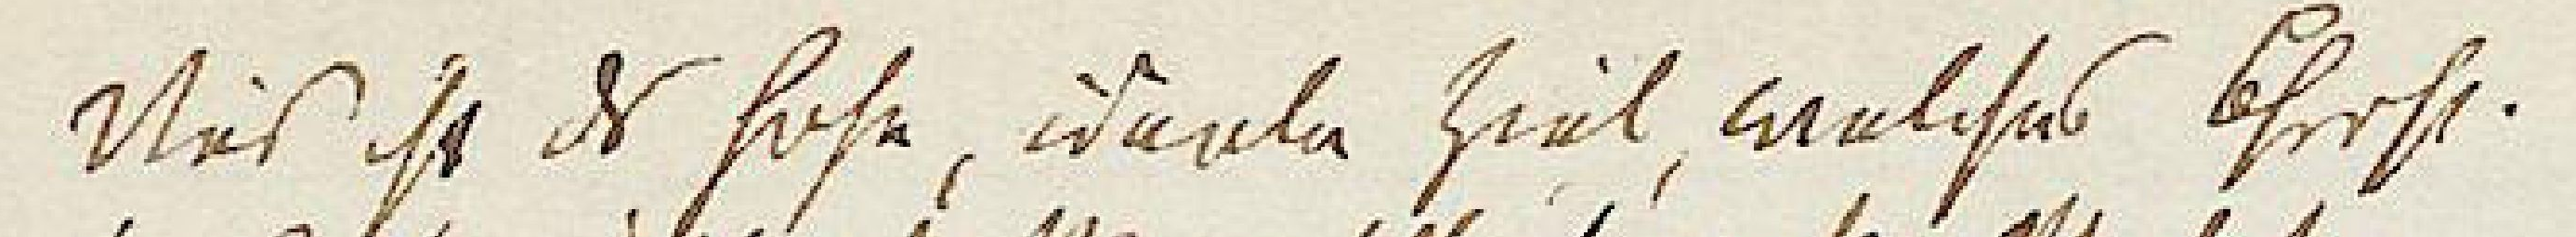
Das ist ds Hohe, ideale Ziel, welches Christ.
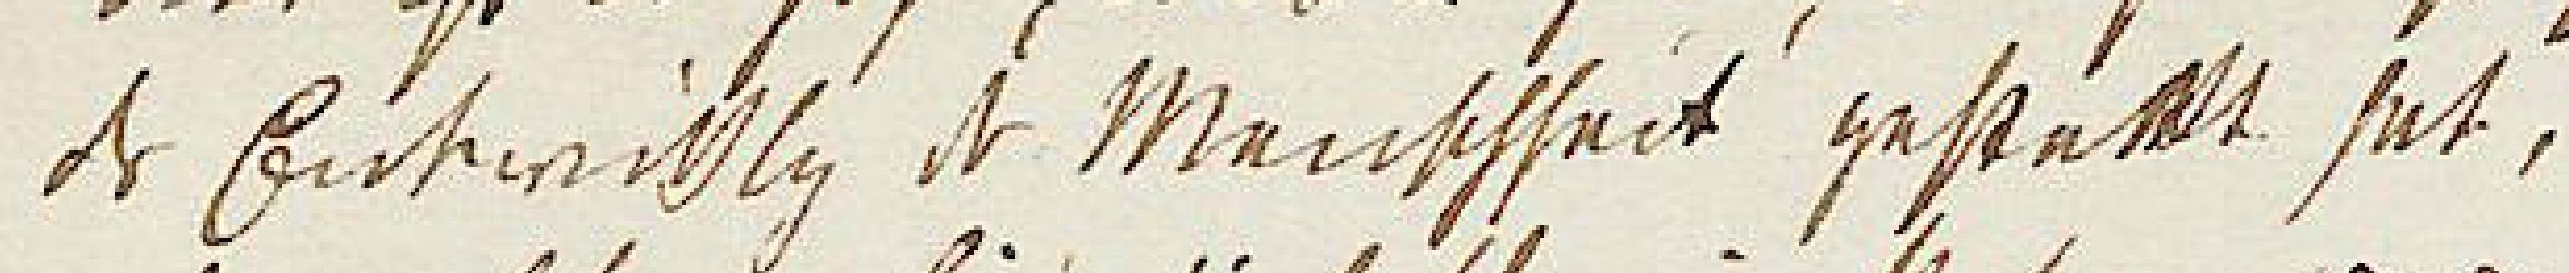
di Entwicklg dr Menschheit gestaltet hat
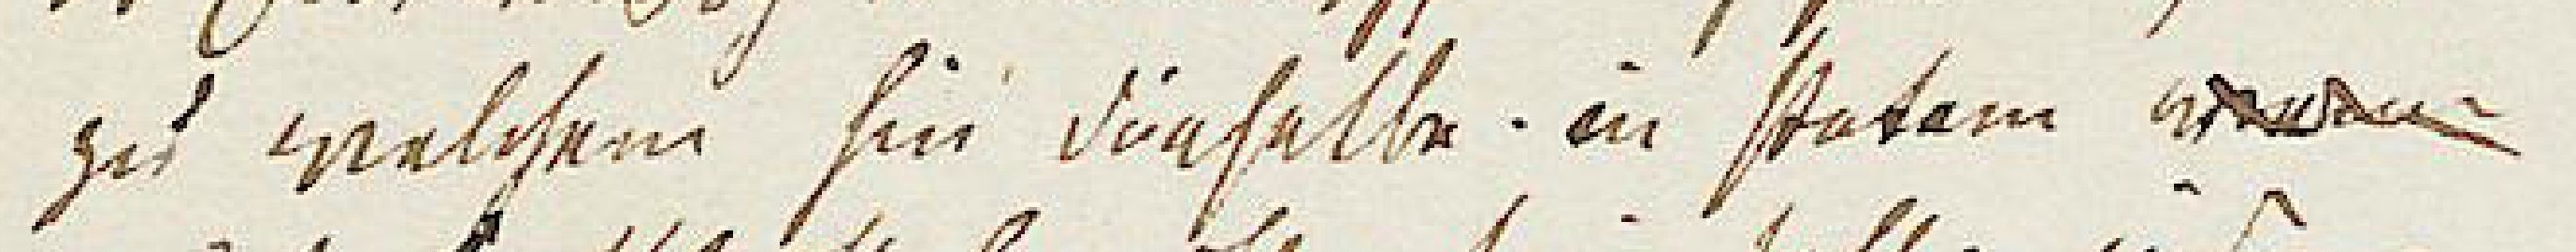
zu welchem sie dieselbe in stetem wenn¬
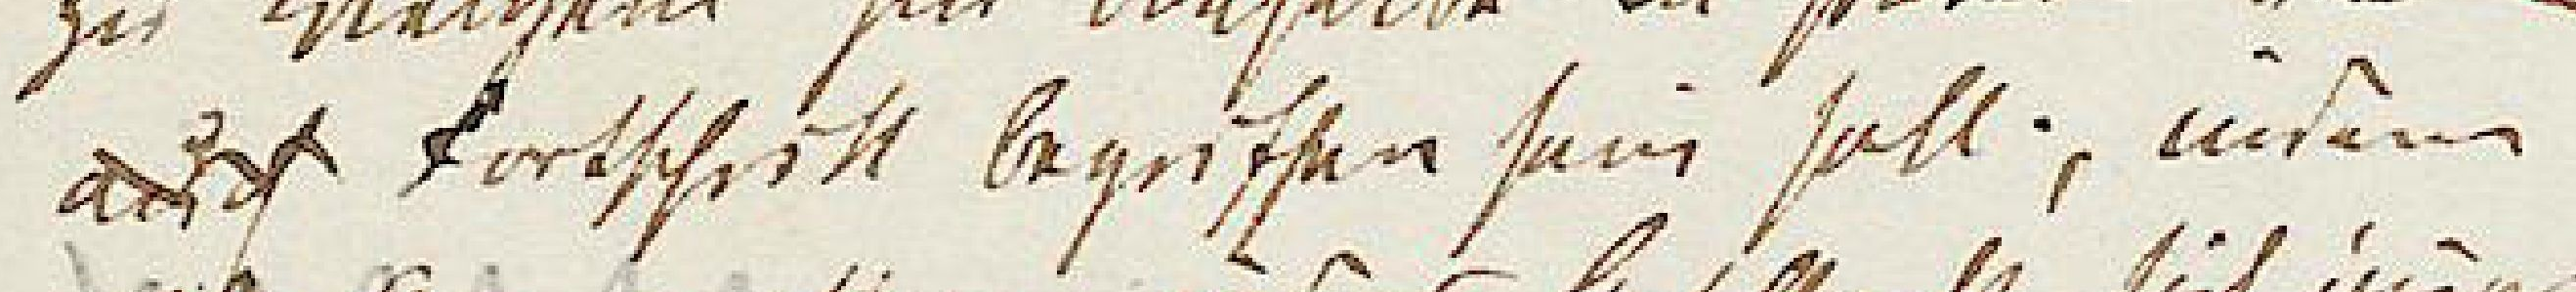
auch Fortschritt begriffen sein soll; indem
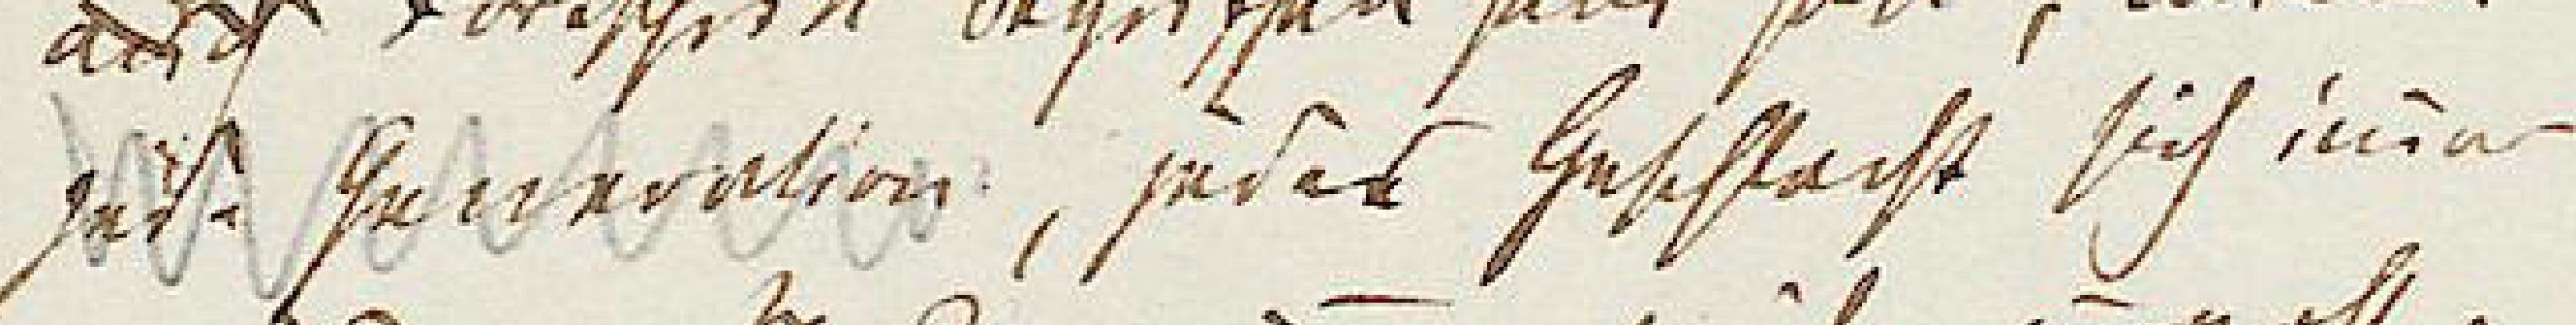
jede Generation, jedes Geschlecht sich imer¬
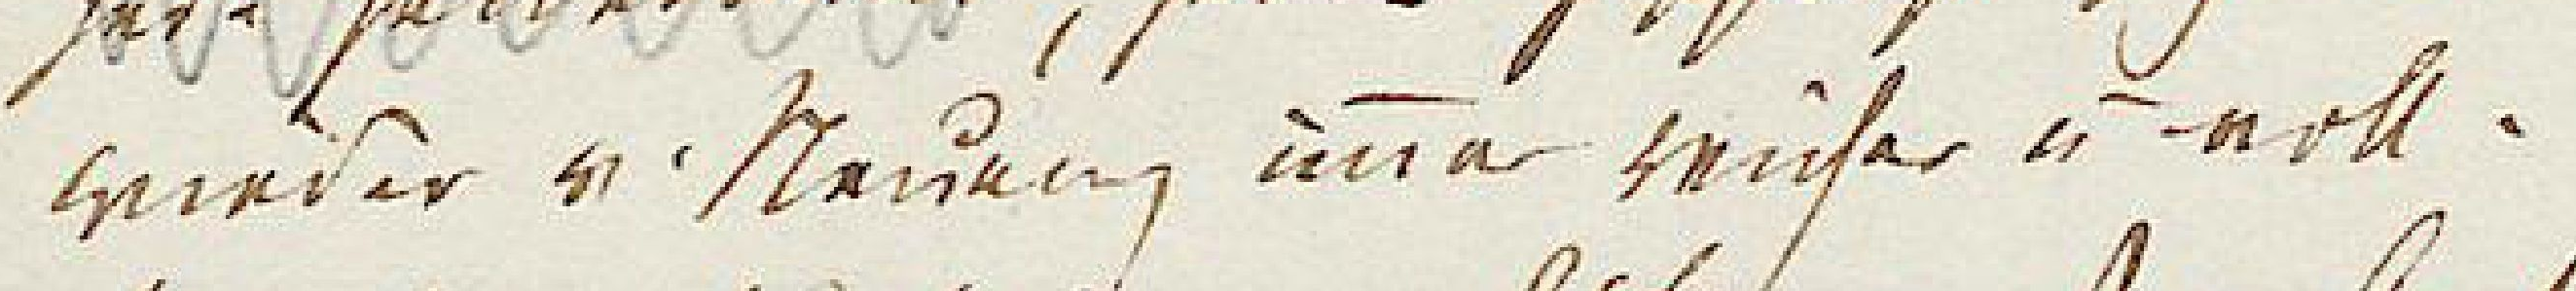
wieder v. Neuem, imer reicher u. voll¬
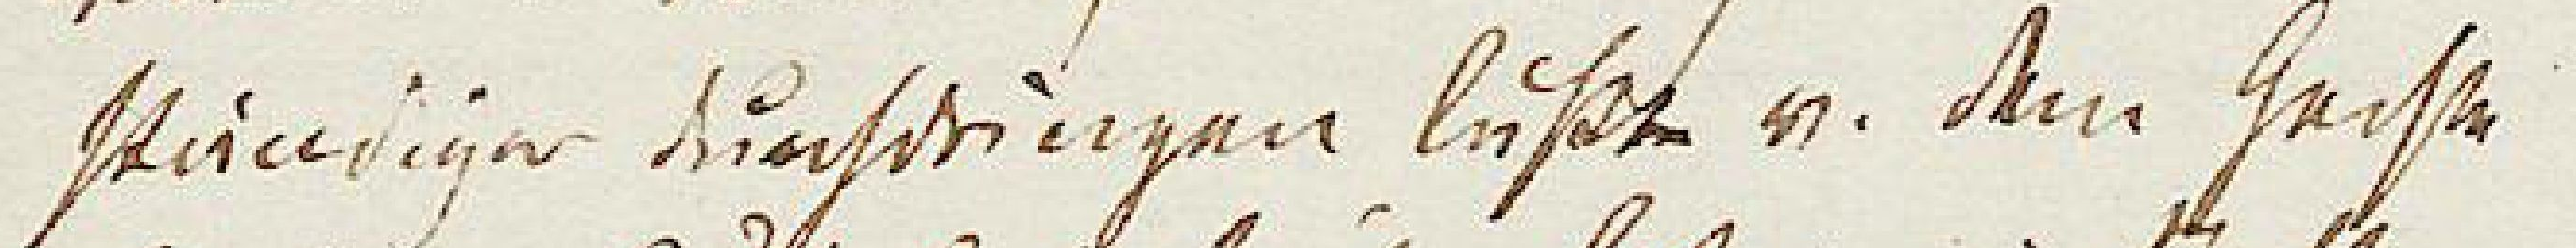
ständiger durchdringen läßt v. dem Geiste
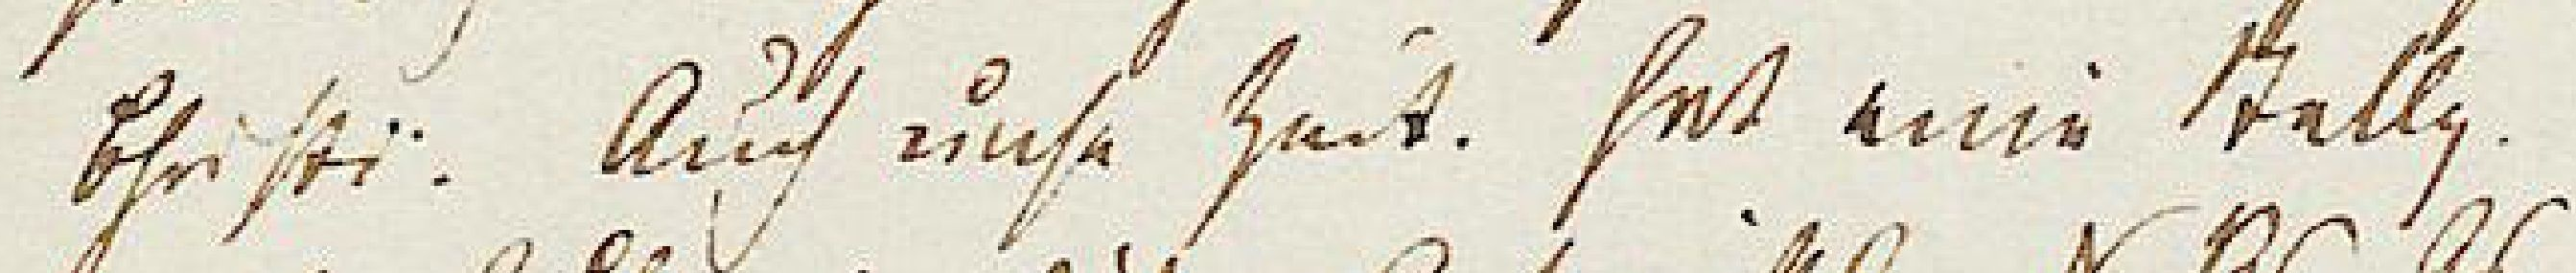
Christi. Auch unsr Zeit hat eine Stellg
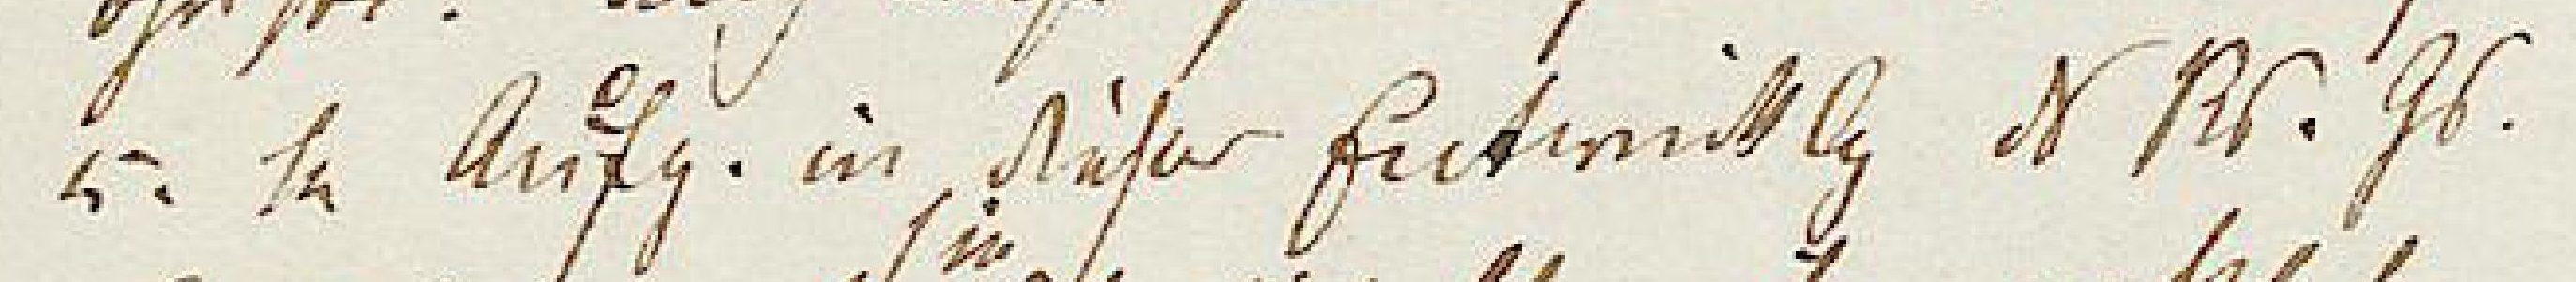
u. 1. Aufg. in dieser Entwiklg. ds. Rs. Gs.
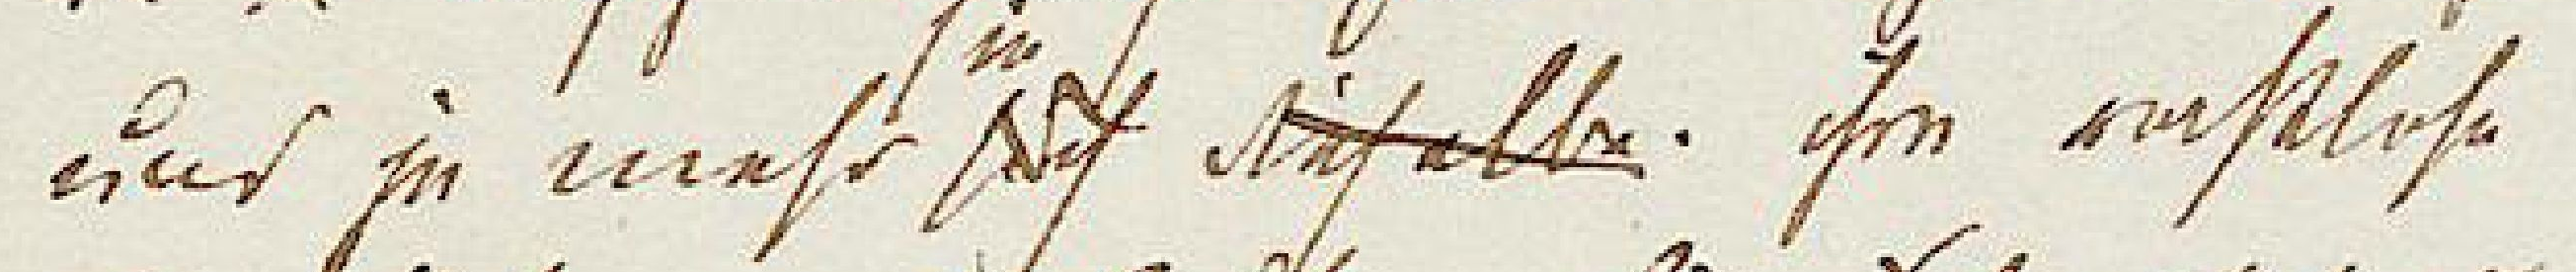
und je mehr sie sich dieselbe ihn rastlose
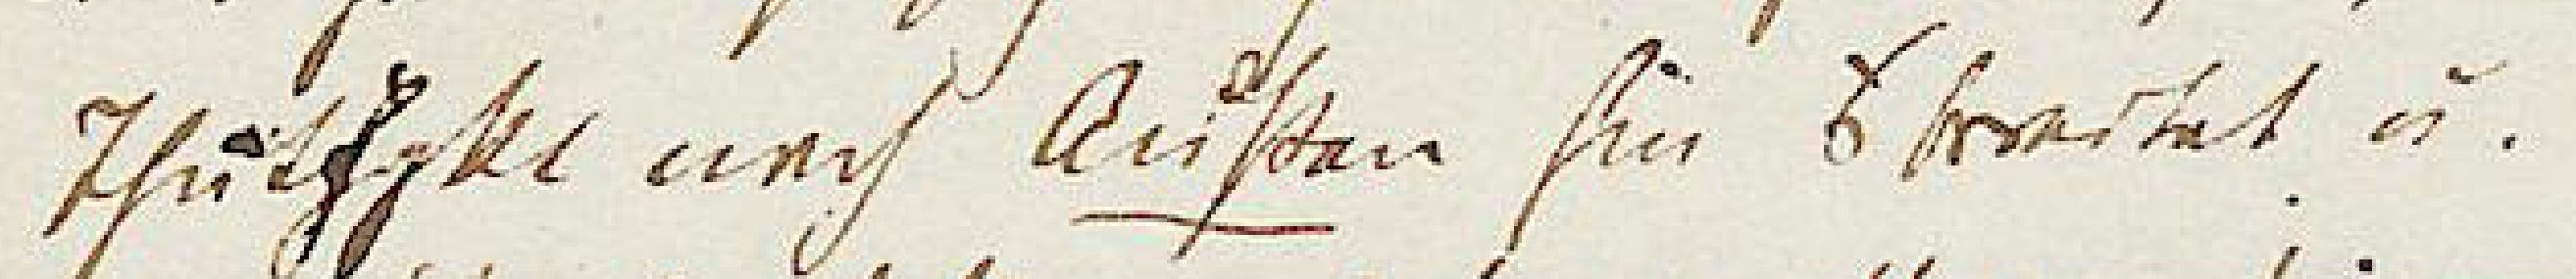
Thäthgkeit nach Außen hin abreitet u.
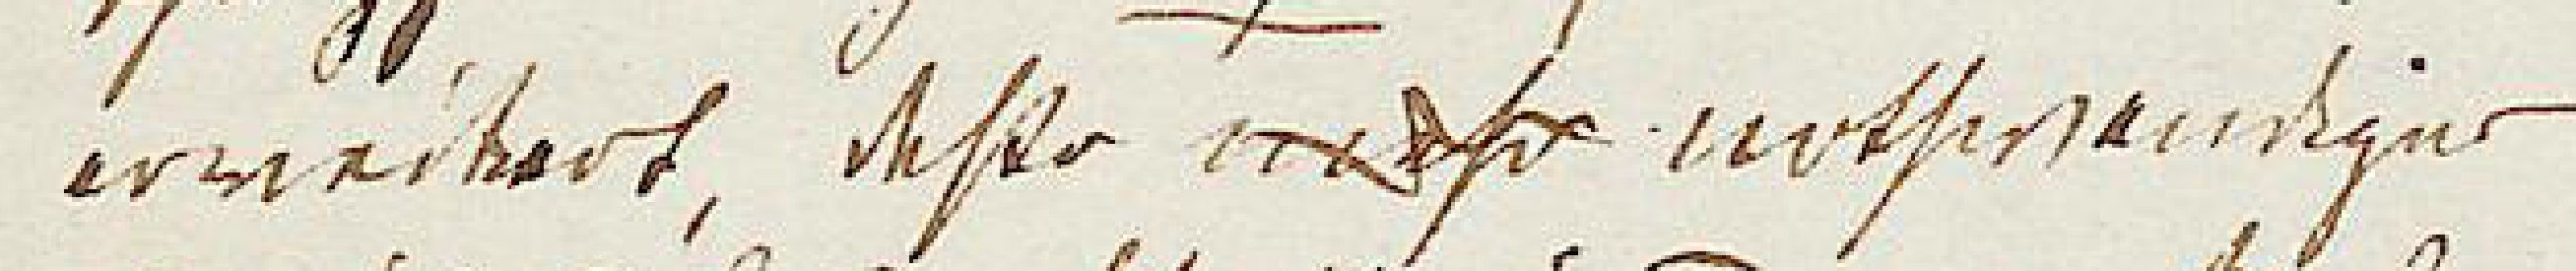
erweitert, desto mehr nothwendiger
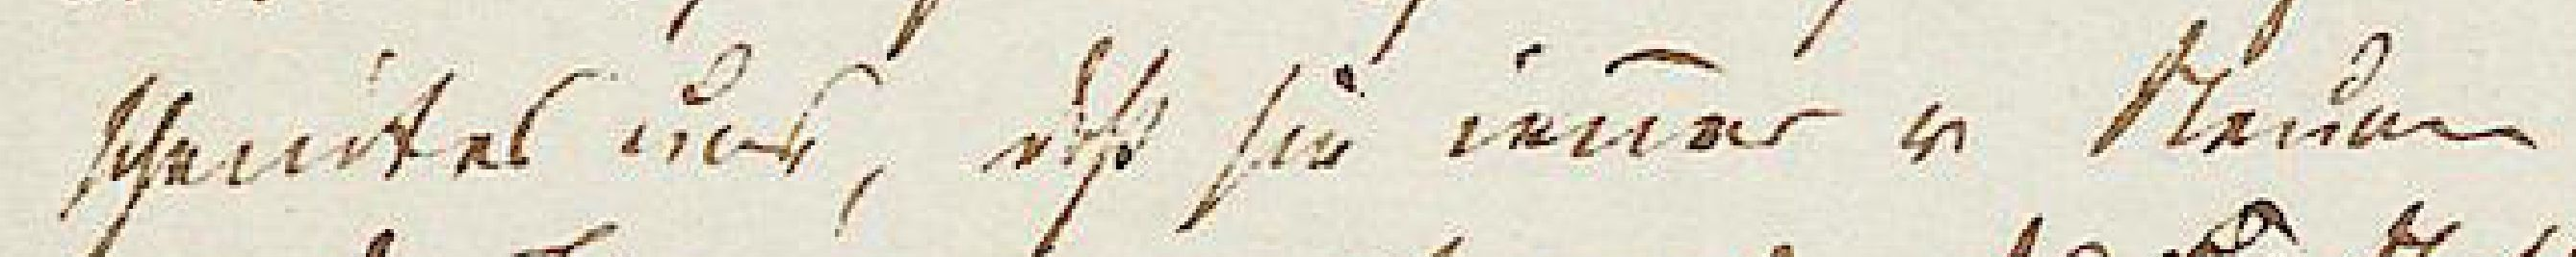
scheint es und, daß sie imer v Neuem
